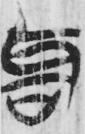○（始）
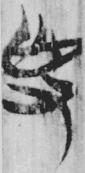拃（作）
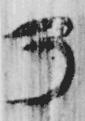乃
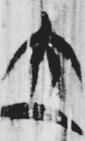立
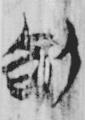咎（皋）
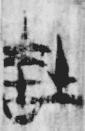○（陶）
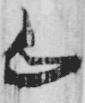㠯（以）
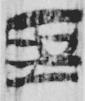爲
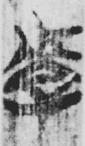李
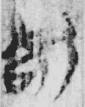咎（皋）
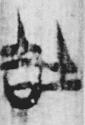○（陶）
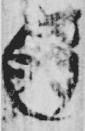既
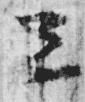已
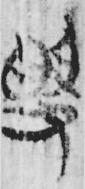受
